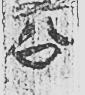公
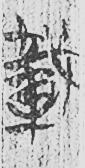載
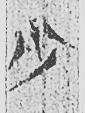少
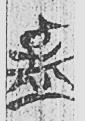{孔皿}
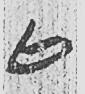㠯（以）
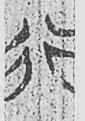行
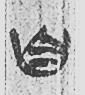自
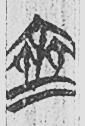齊
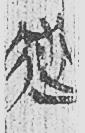述
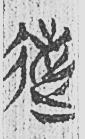逃
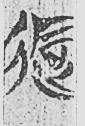{辶石}
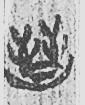晉
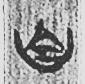自
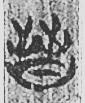晉
